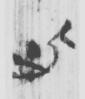此
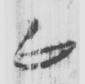㠯（以）
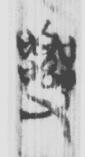𠧏（亂）
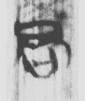君
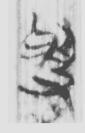受
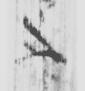之
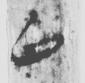㠯（以）
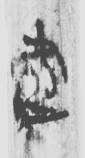{辶旅}
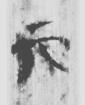亓
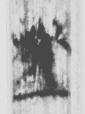立
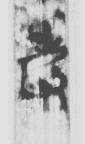皮
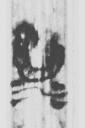湎
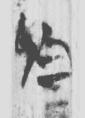於
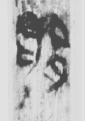{爿兔}
